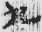九
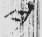月
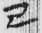己
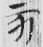亥
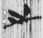之
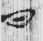日
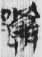○（畢）
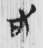右
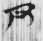尹
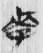李
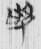受
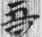○（期）
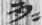十月
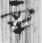辛
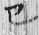巳
